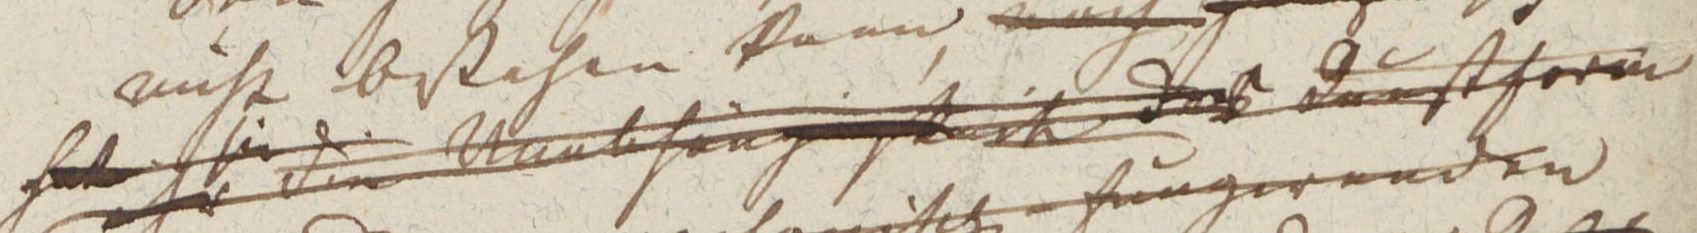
ihr die Unabhängigkeit desr hat sie Kunstform
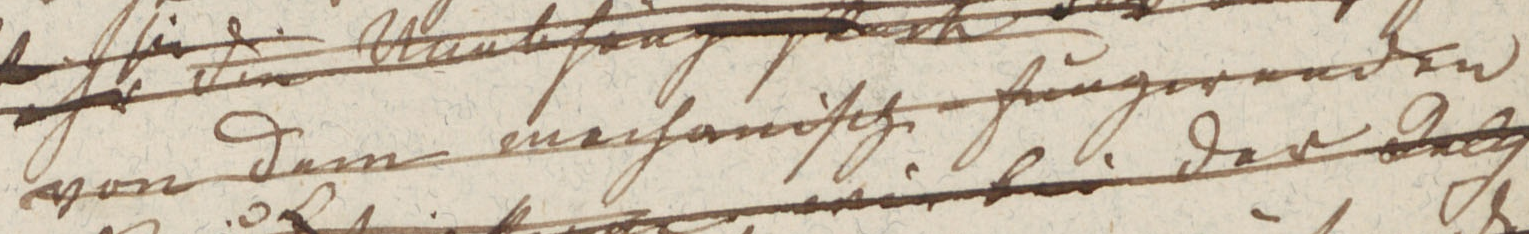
von dem mechansich-fungirenden
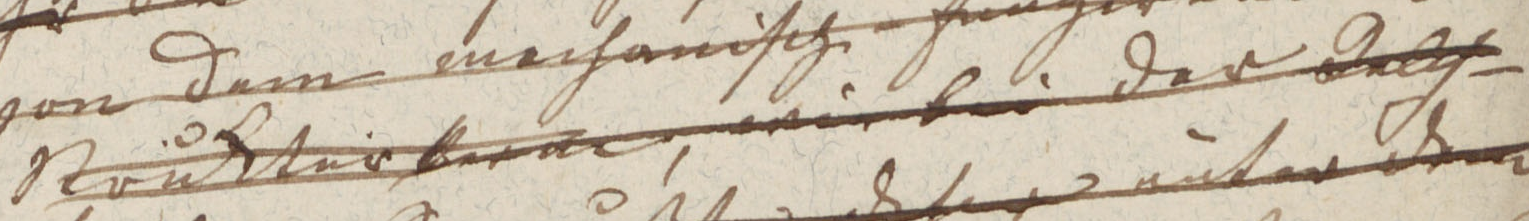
Strukturkerne, wie bei der Kelch-
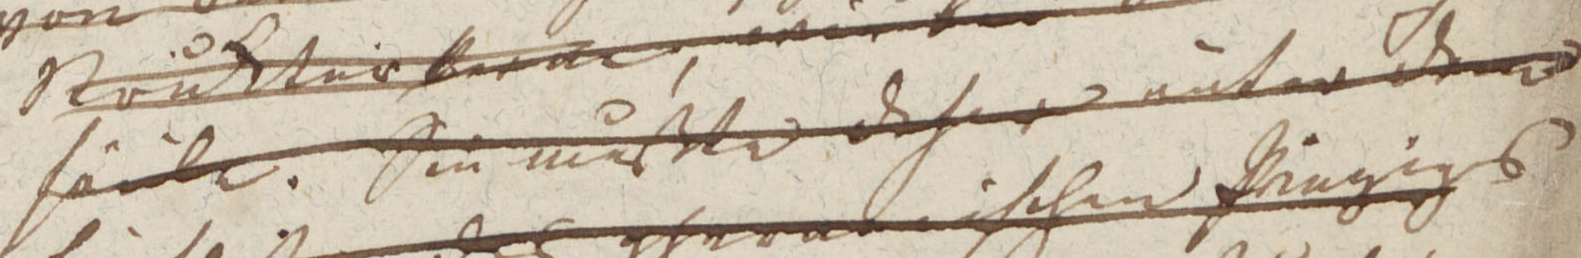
säule. Sie müsste daher unter dem
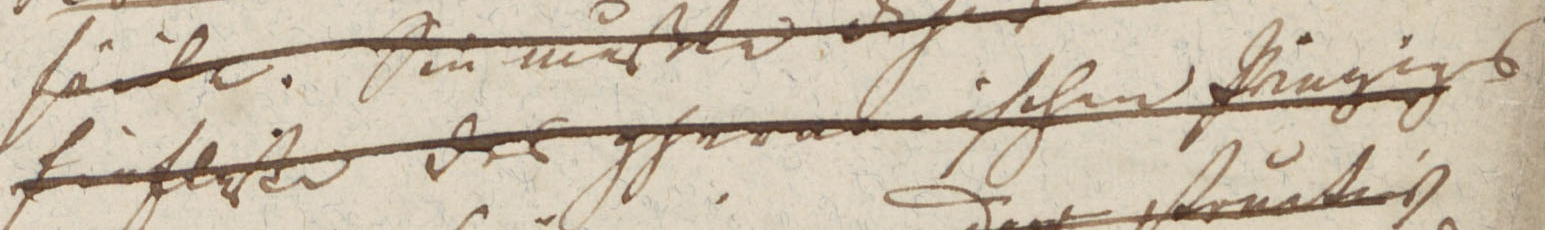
Einflusse des pharaonischen Prinzips
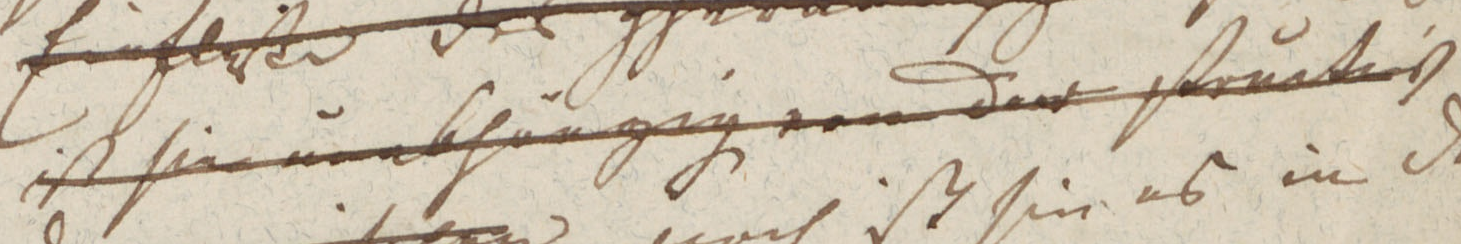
ist sie unabhängig von der structiv
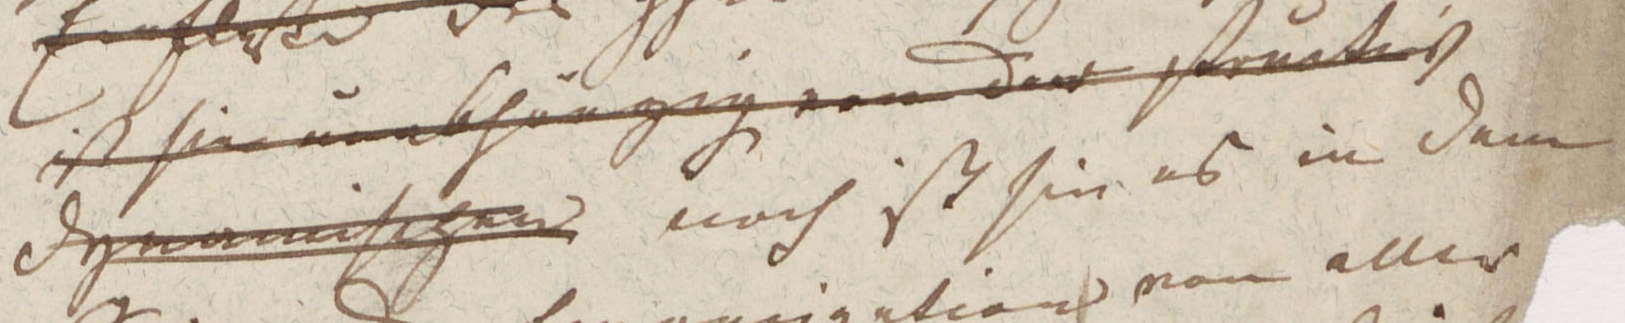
dynamischen noch ist sie es in dem
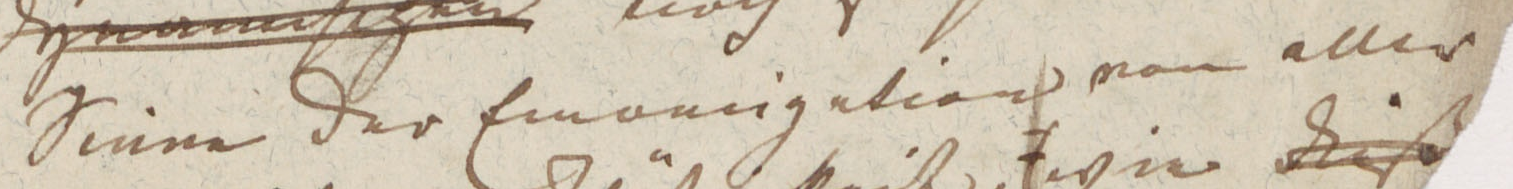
Sinne der Emancipation von aller
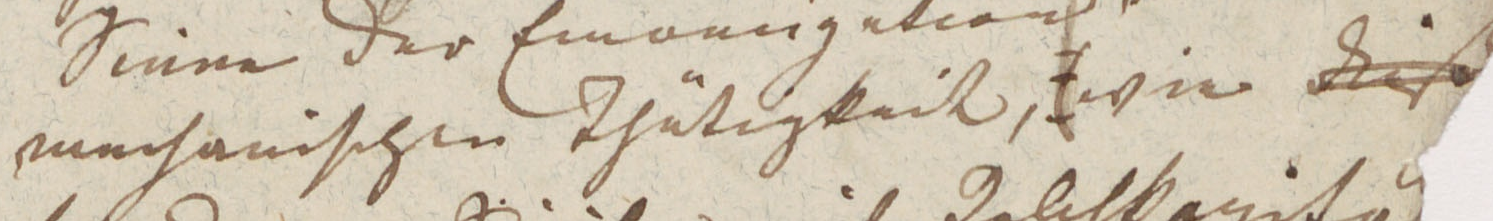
mechanischen Thätigkeit, (wie diess
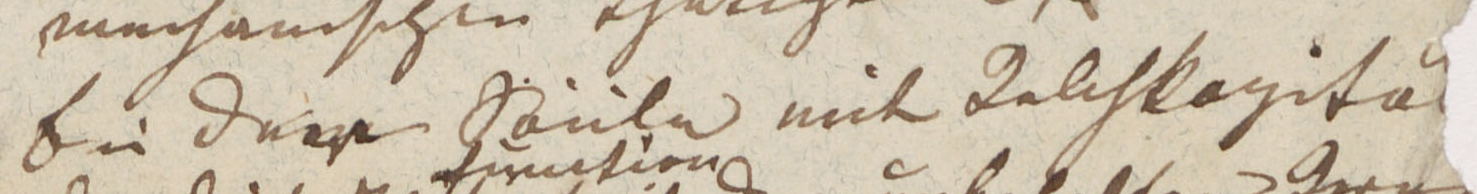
bei demr Säule mit Kelchkapitäl
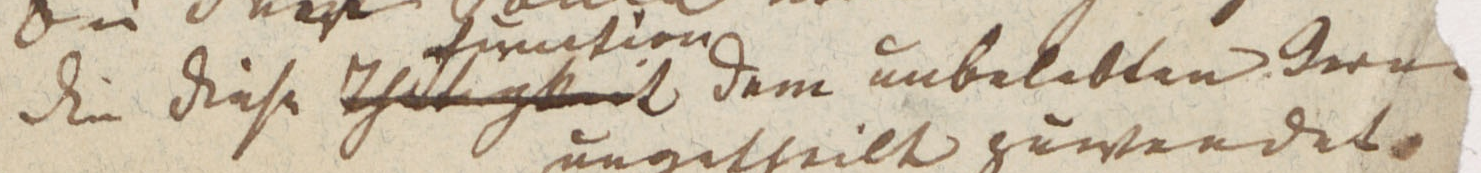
die diese Thätigkeit Function dem unbelebten Kern
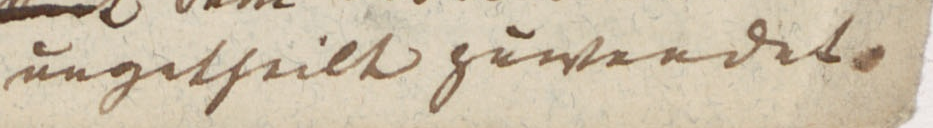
ungetheilt zuwendet.
